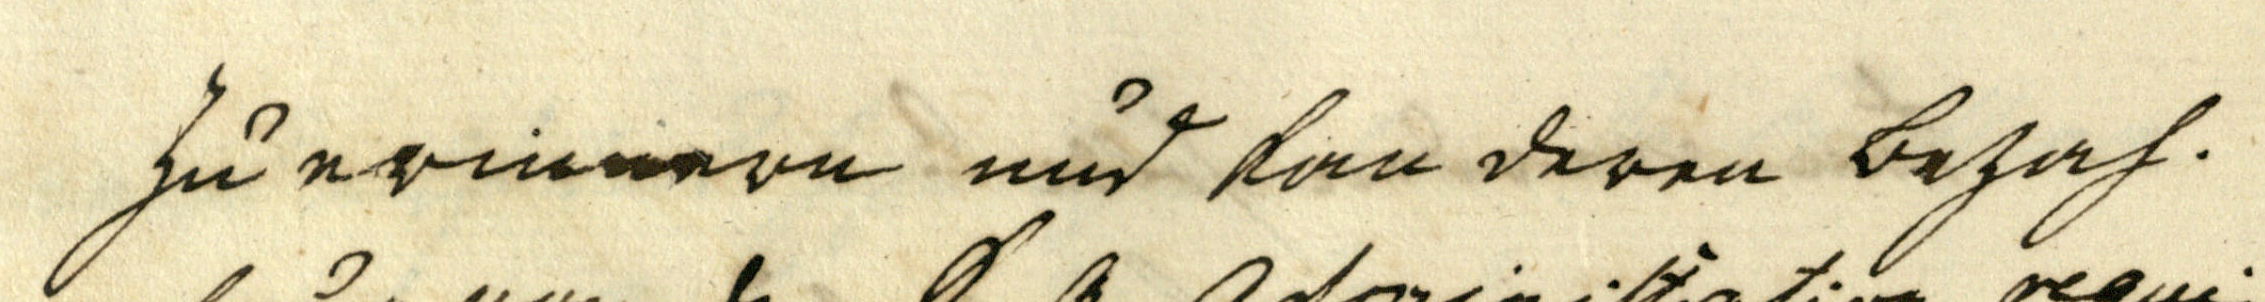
zu erinnern und kan deren Bezah¬
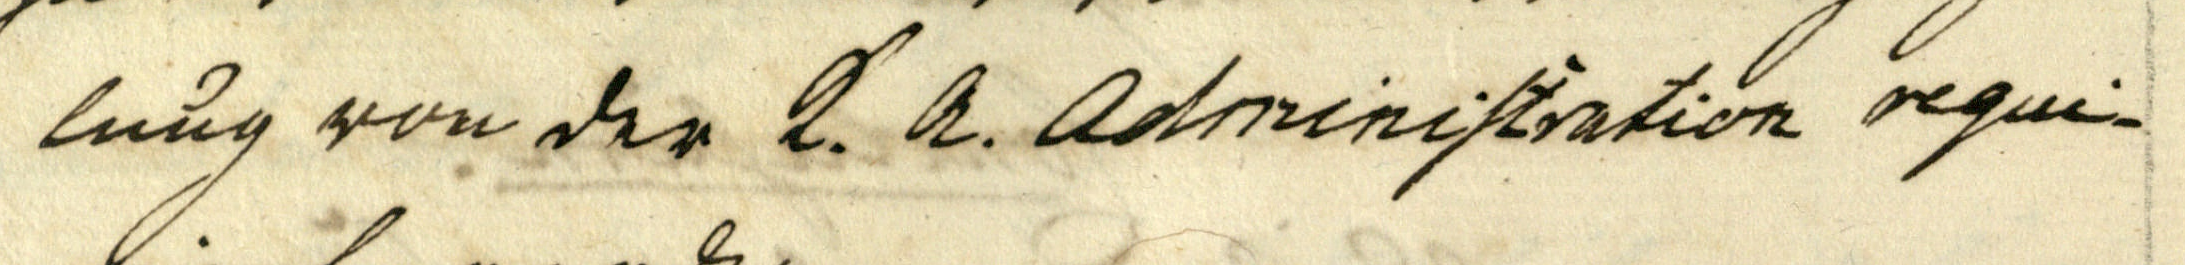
lung von der K. A. Administration requi¬
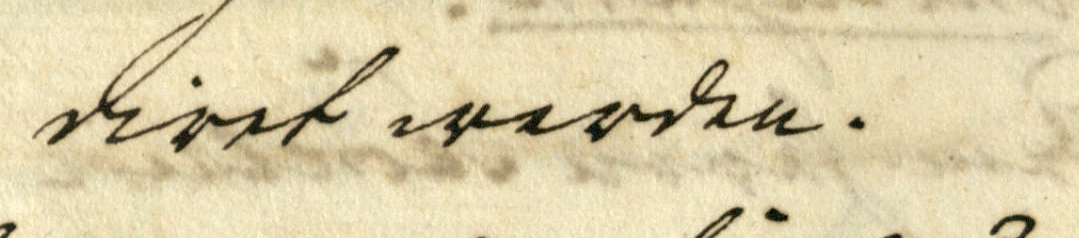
riret werden.
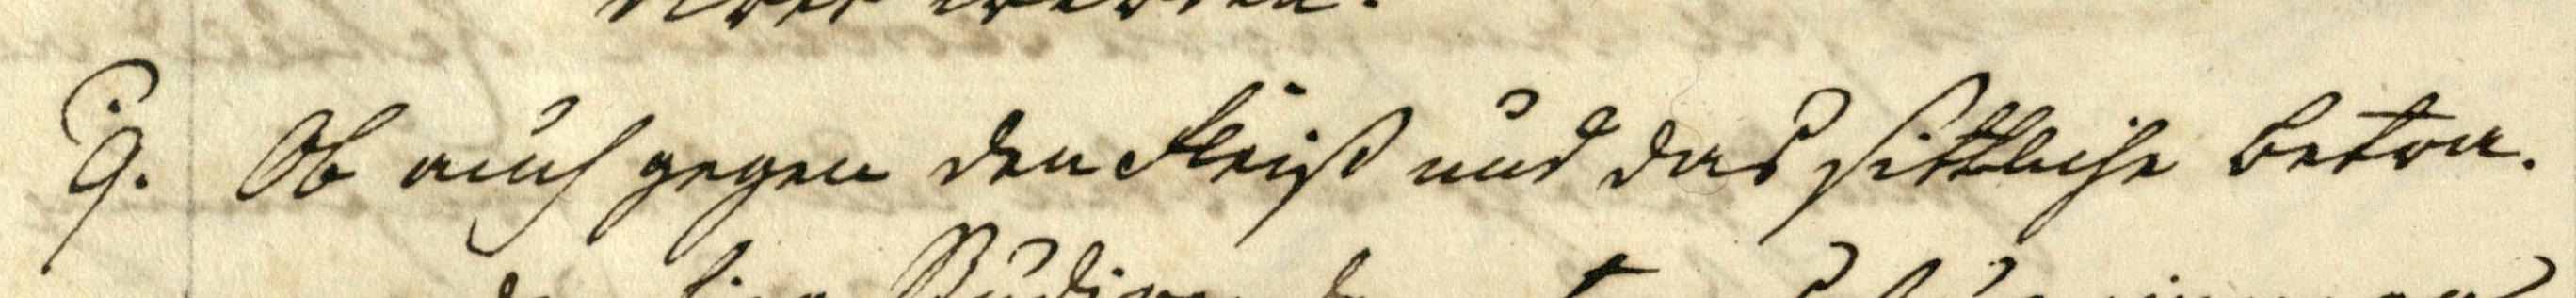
9. Ob auch gegen den Fleiß und das sittliche Betra¬
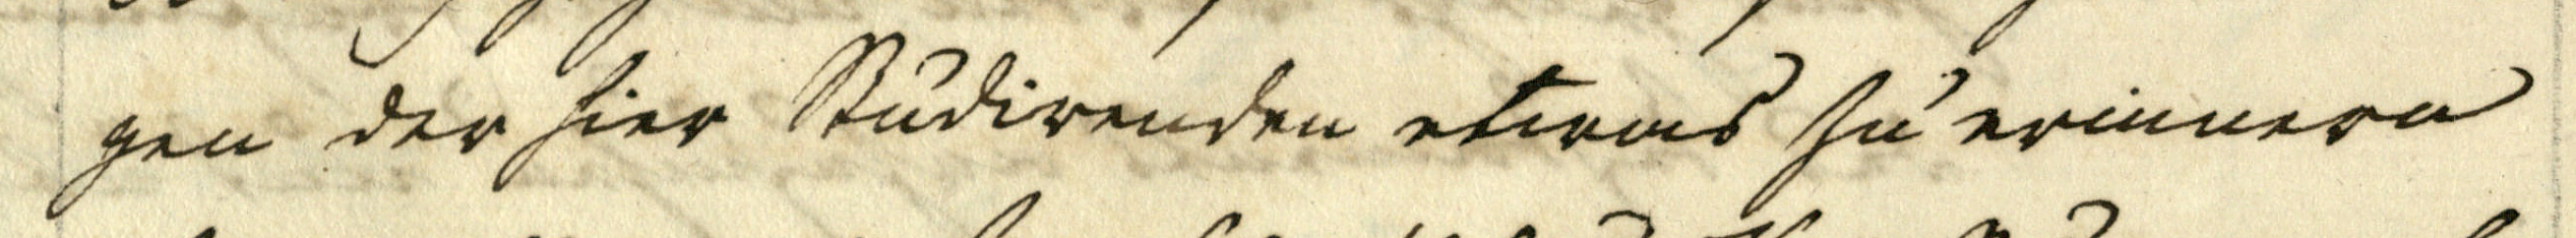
gen der hier Studirenden etwas zu erinnern
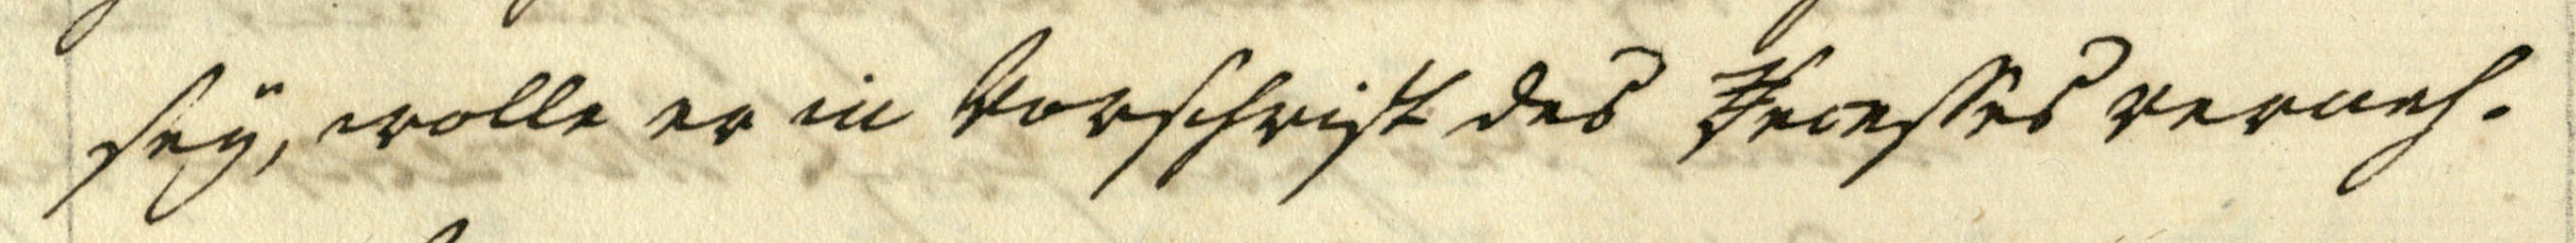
seÿ, wolle er im Vorschrift des Recesses verneh¬
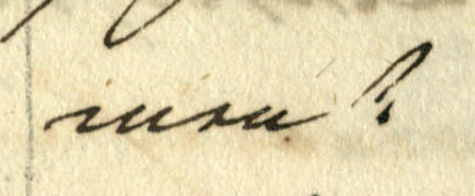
men ?
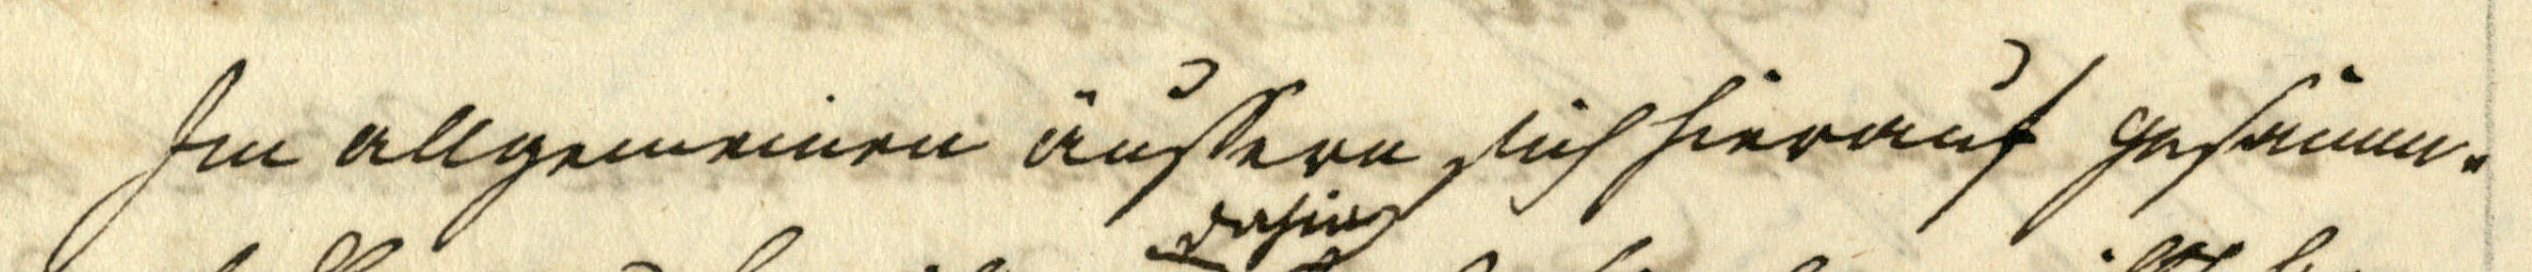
Im allgemeinen äussern sich hierauf gesamm¬
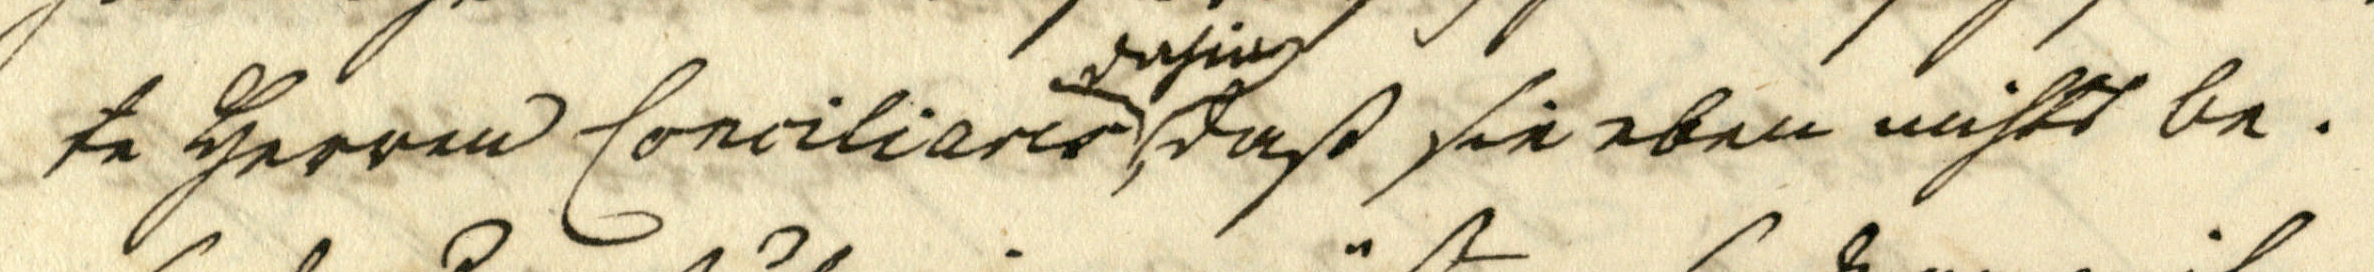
te Herren Conciliares dahin, daß sie eben nichts be¬
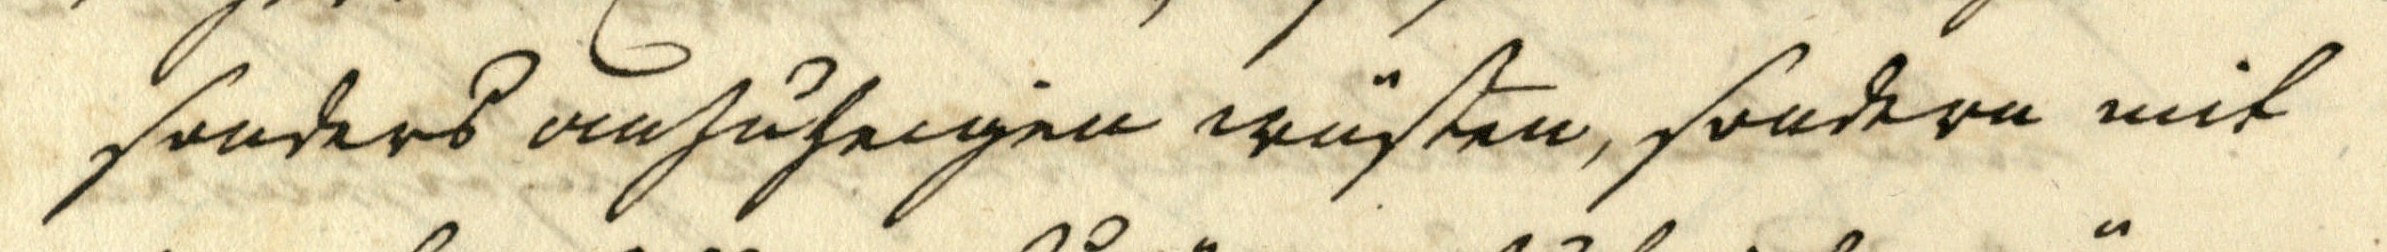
sonders anzuzeigen wüßten, sondern mit
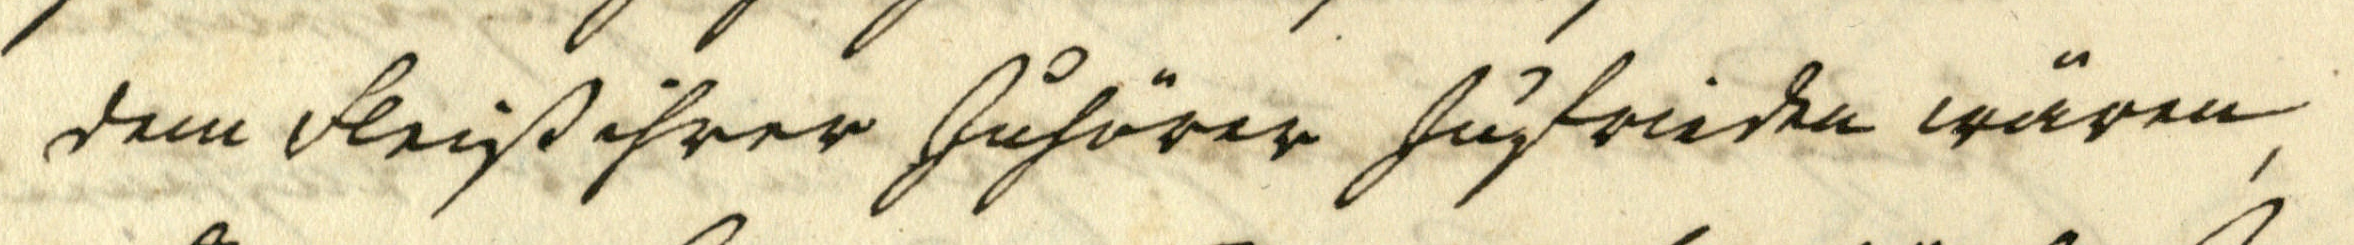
dem Fleiß ihrer Zuhörer zufrieden wären,
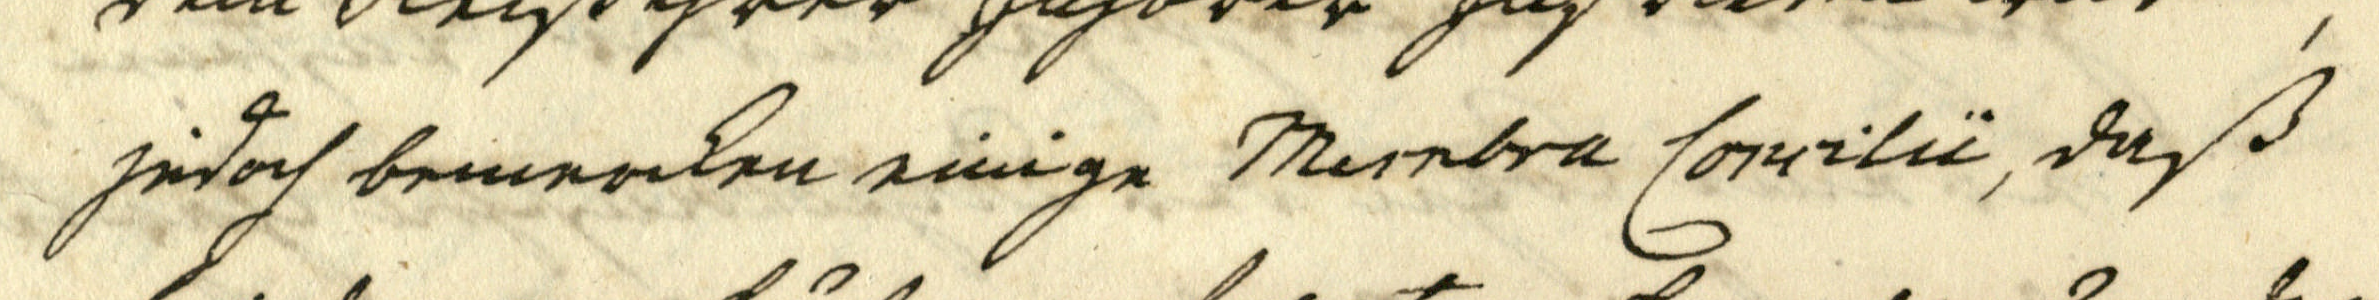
jedoch bemercken einige Membra Concilii, daß
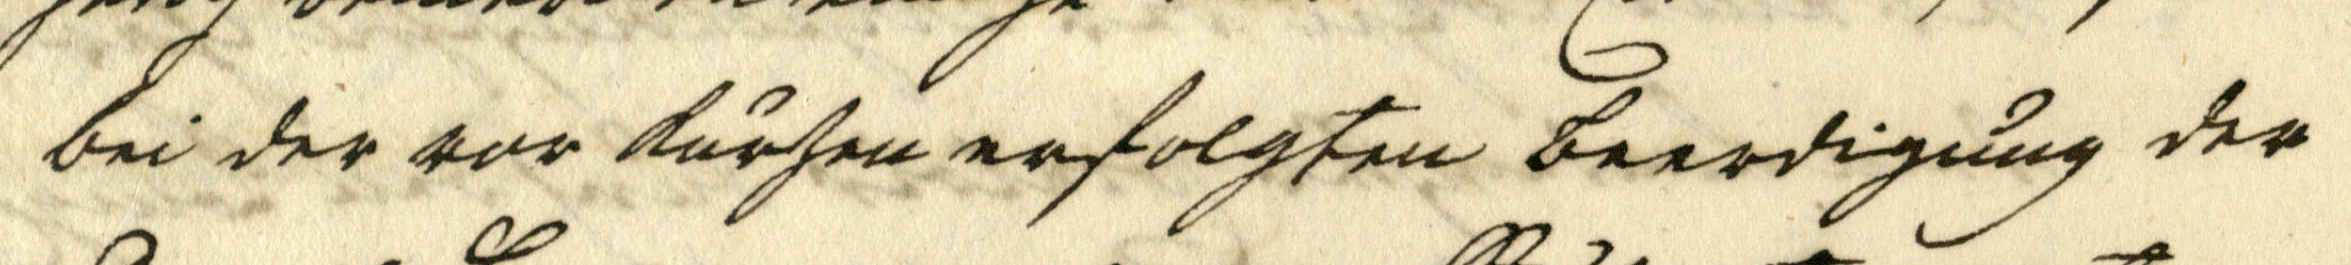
bei der vor kurzen erfolgten Beerdigung der
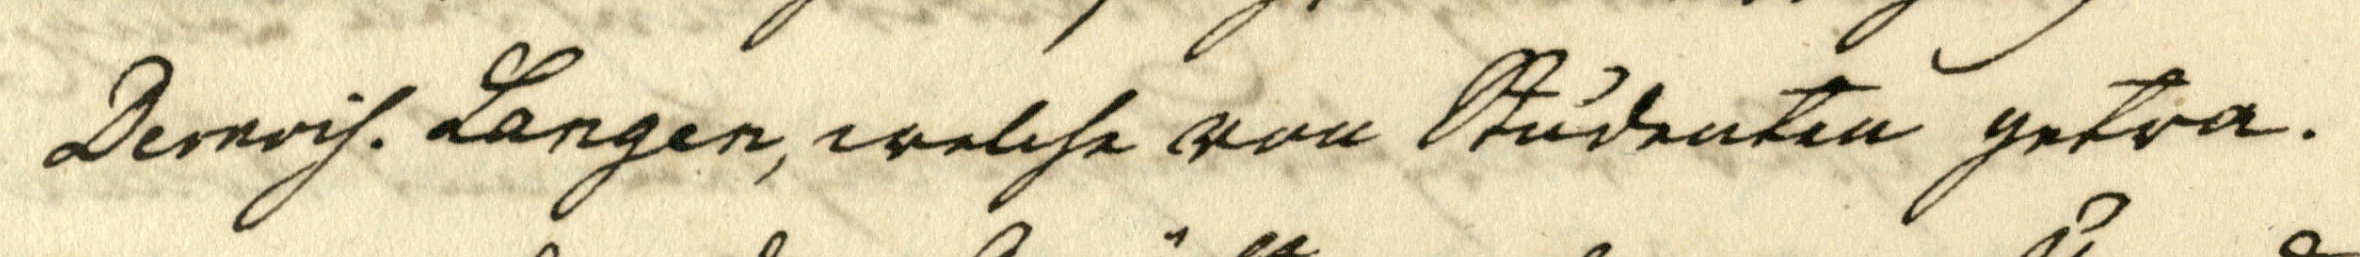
Demois. Langen, welche von Studenten getra¬
